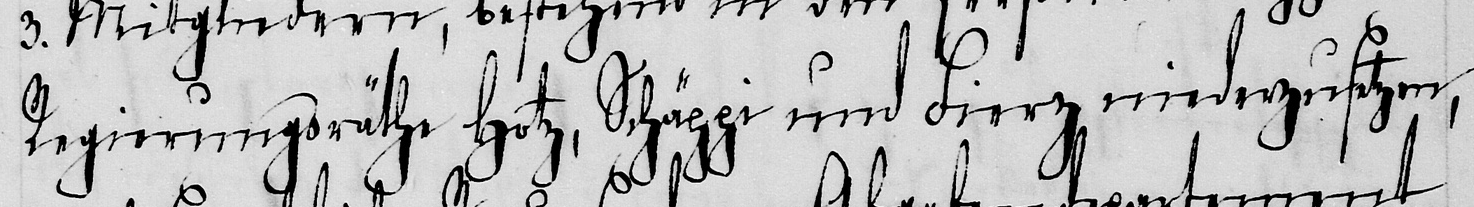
Regierungsräthe Hotz, Schäppi und Fierz niederzusetzen,
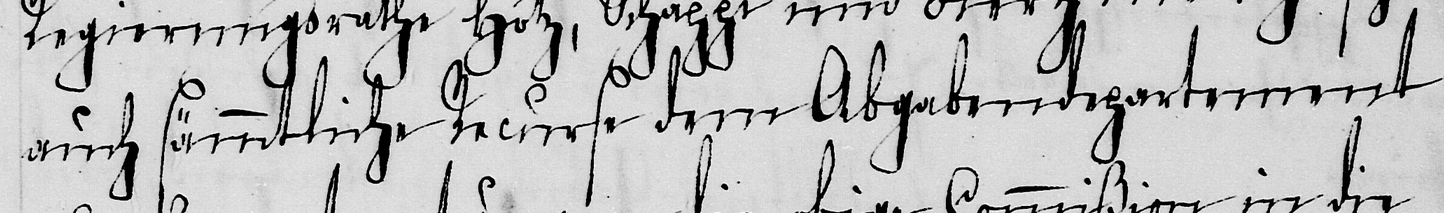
auch sämmtliche Recurse dem Abgabendepartement
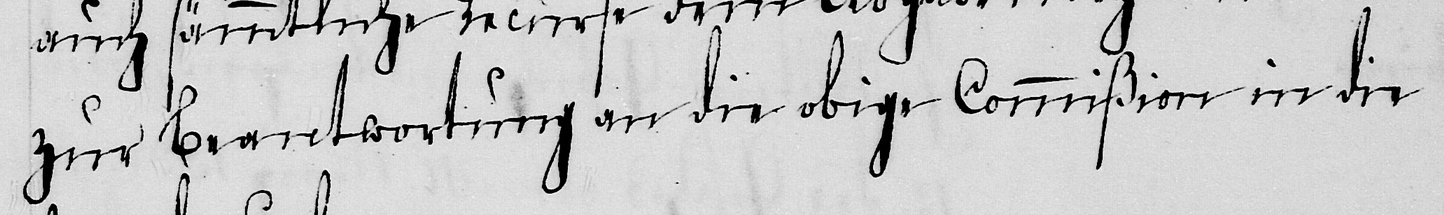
zur Beantwortung an die obige Commißion in die
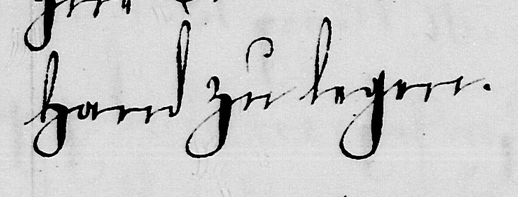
Hand zu legen.
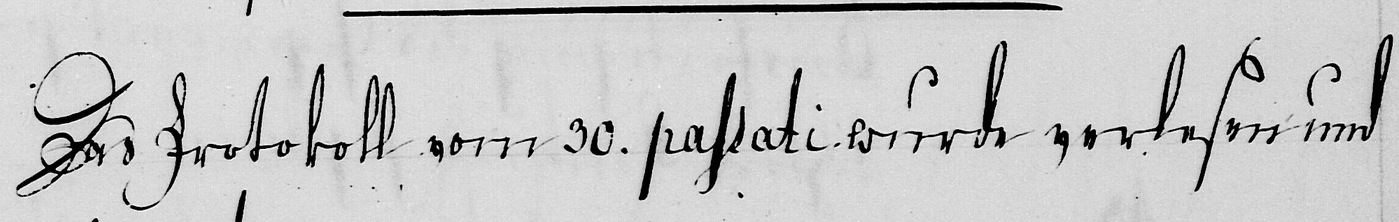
Das Protokoll vom 30. passati wurde verlesen und
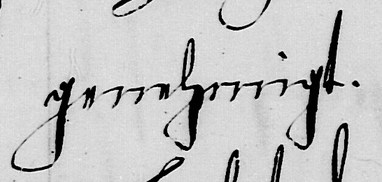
genehmigt.
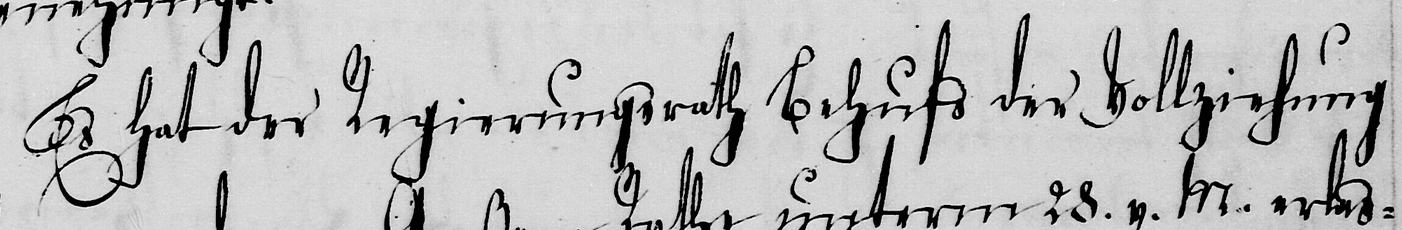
Es hat der Regierungsrath Behufs der Vollziehung
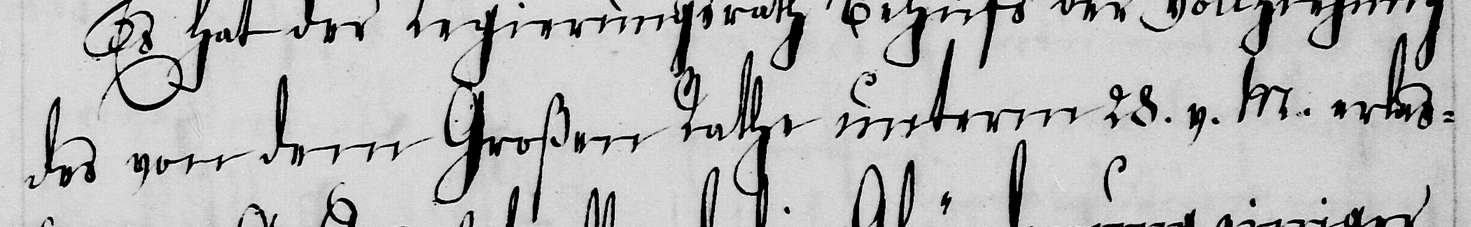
des von dem Regierungsrathe unterm 9ten v. M. erlaß¬
